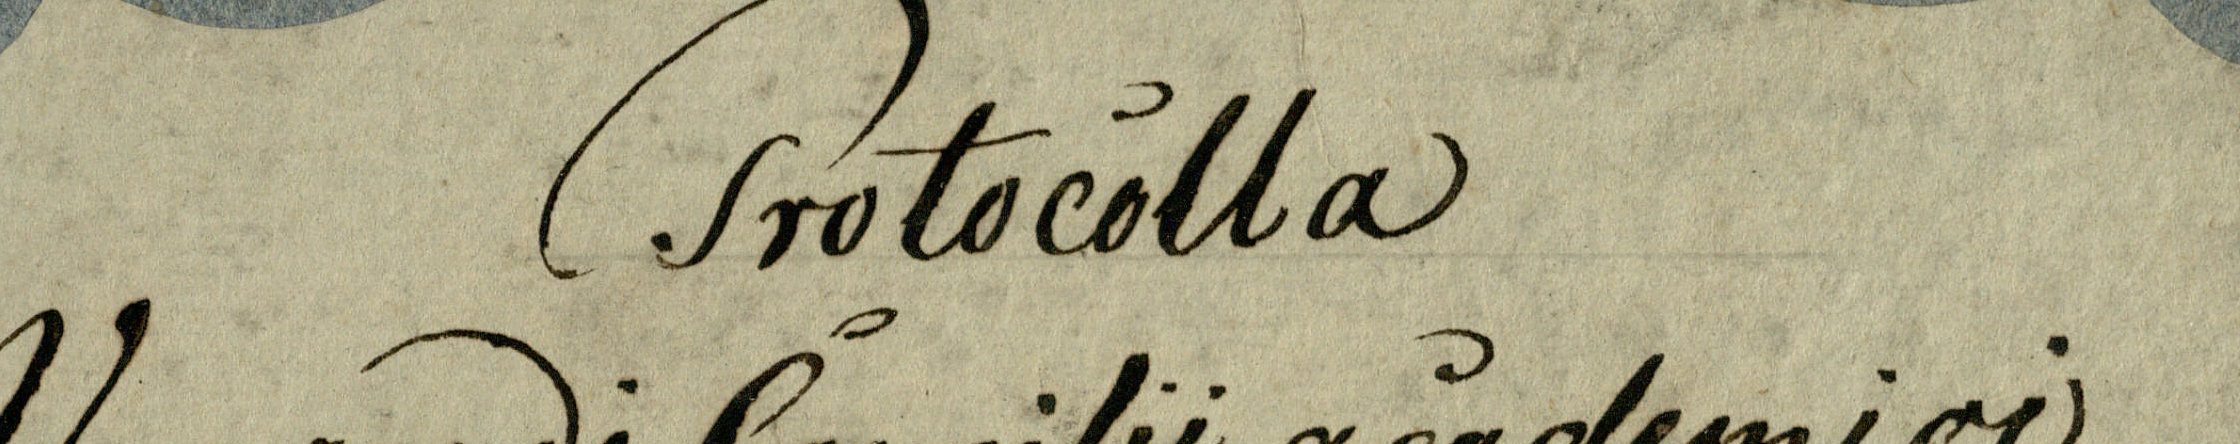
Protocolla
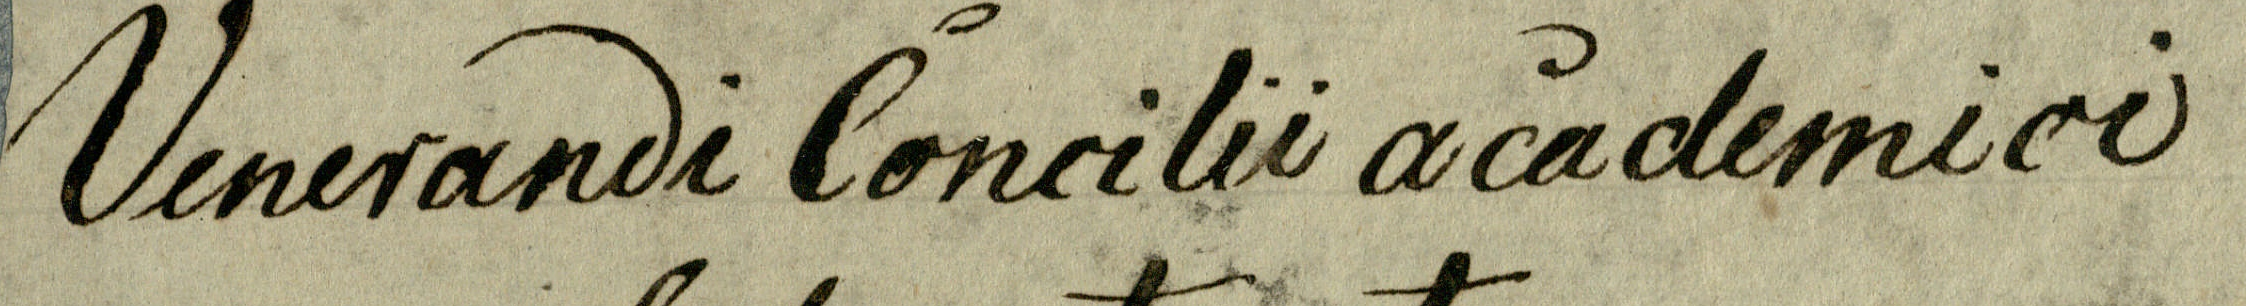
Venerandi Concilii academici
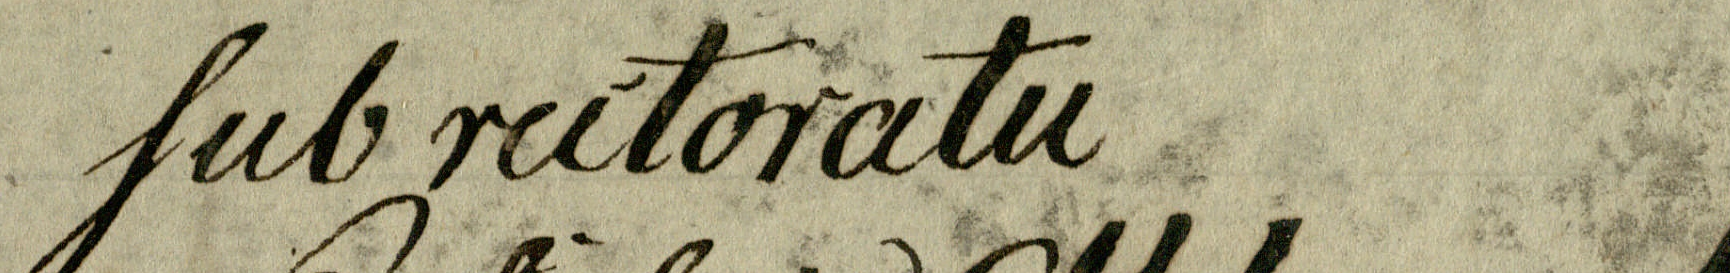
sub rectoratu
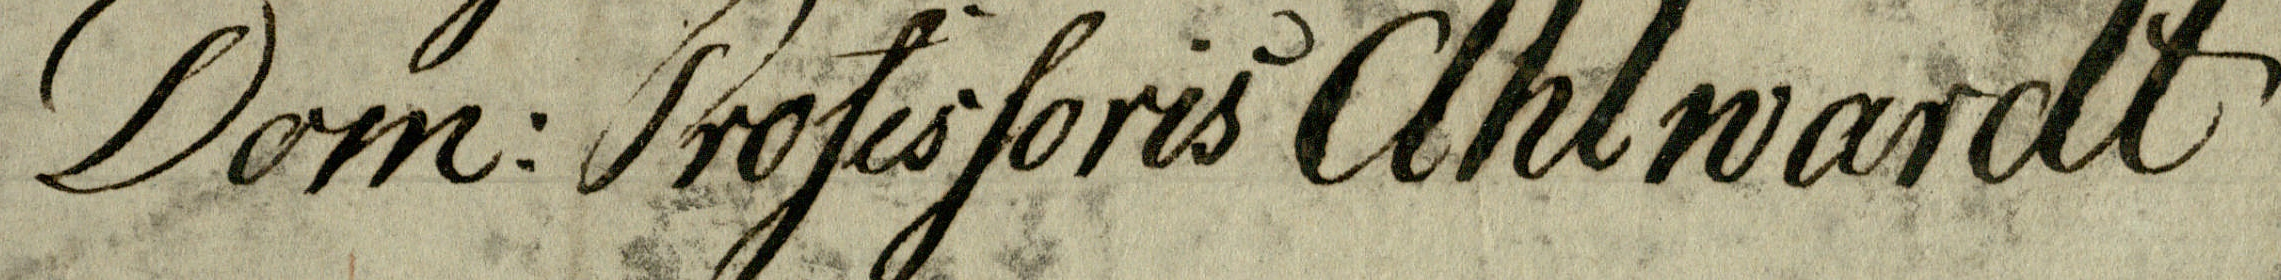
Dom: Professoris Ahlwardt
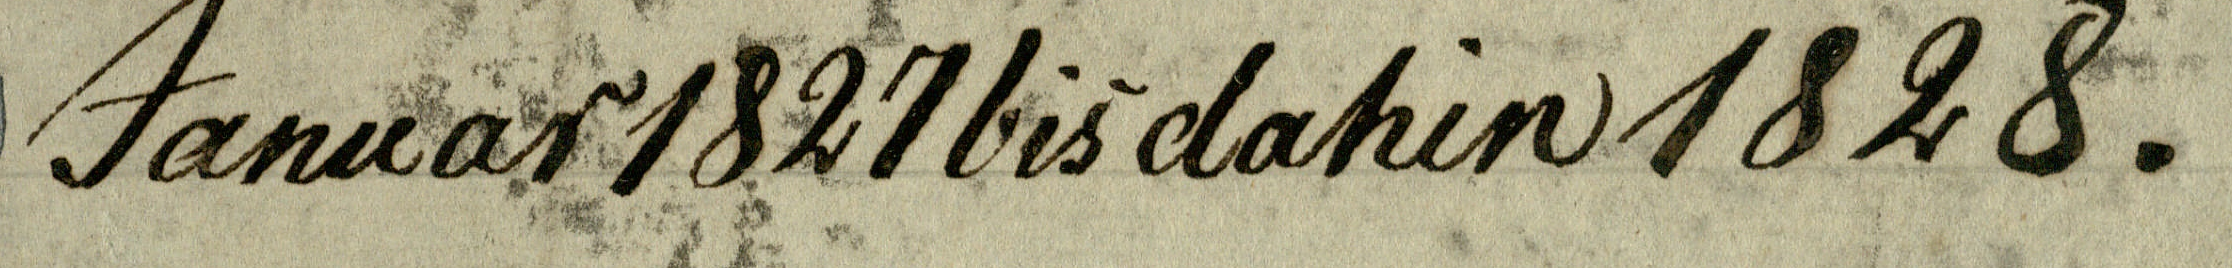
Januar 1827 bis dahin 1828.
